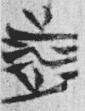涉
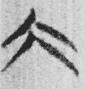大
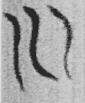川
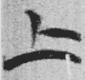上
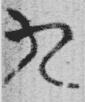九
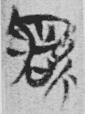䌛（由）
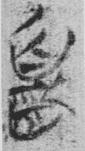頤
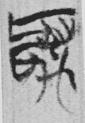○（厲）
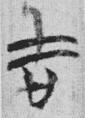吉
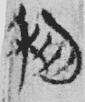利
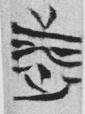涉
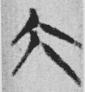大
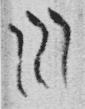川
